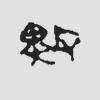{甶矢攴}
